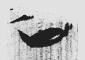司
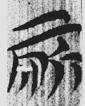所
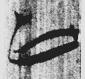㠯（以）
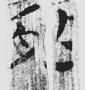敬
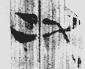又（有）
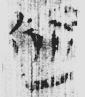○（過）
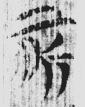所
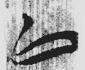㠯（以）
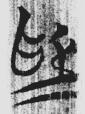爲
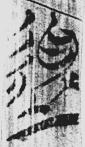○（緩）
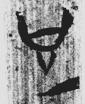也
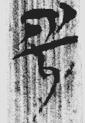先
